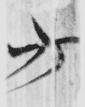方
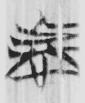者
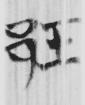{壬阝}
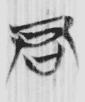君
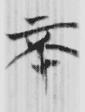不
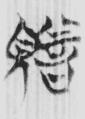{見八言}
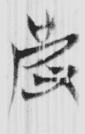皮
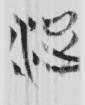{水疋}
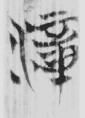漳
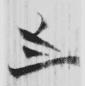之
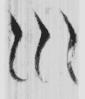川
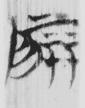{戶幵}
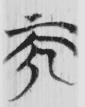而
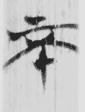不
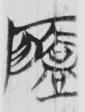{戶盍}
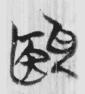殹
